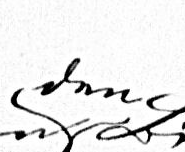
den
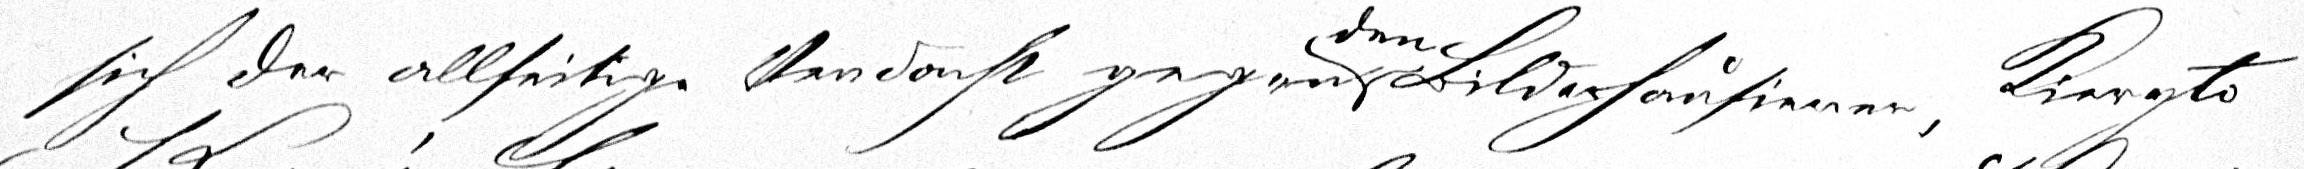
sich der allseitige Verdacht gegen Bildechausiener, Kieryto
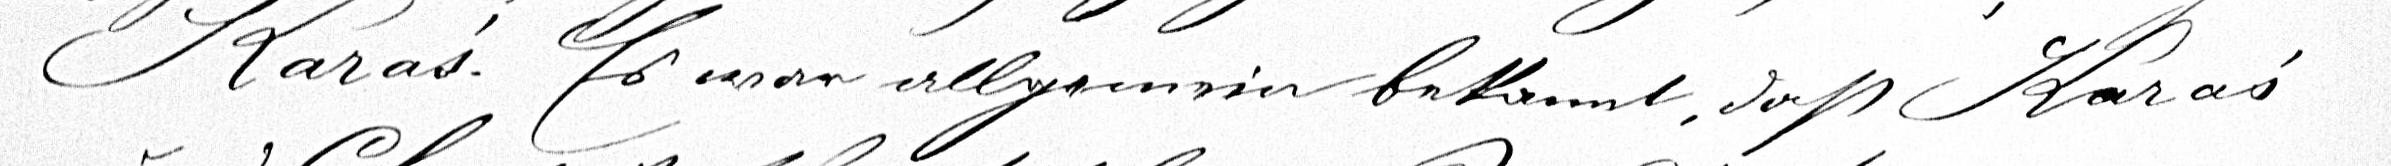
Karaś. Es war allgemein bekannt, daß Karaś
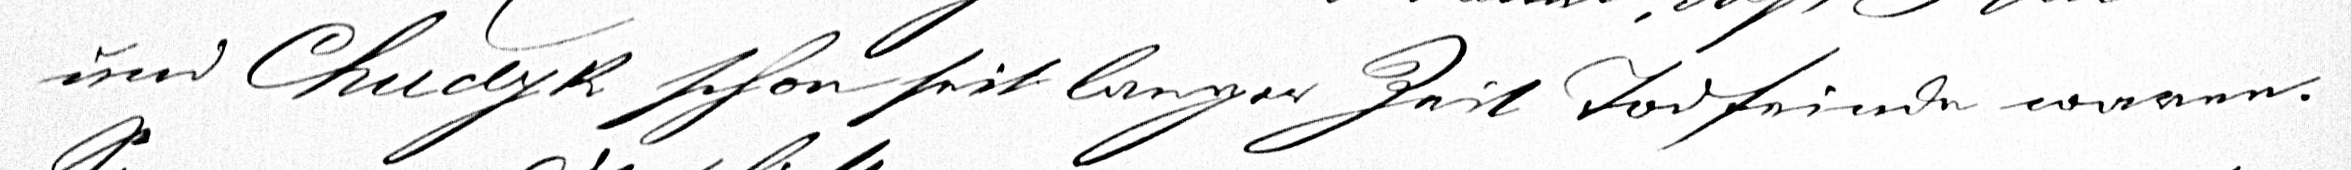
und Chudyk schon seit langen Zeit Todfeinde waren.
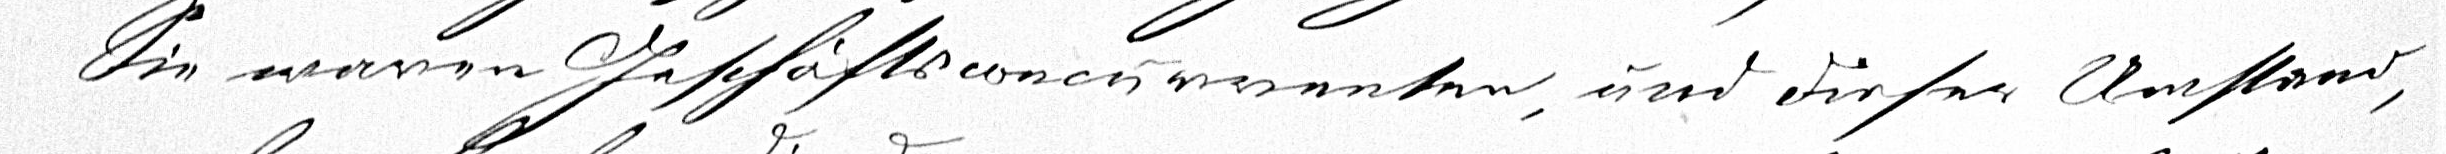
Sie waren Geschäftsconxxcurrenten, und dieser Umstand,
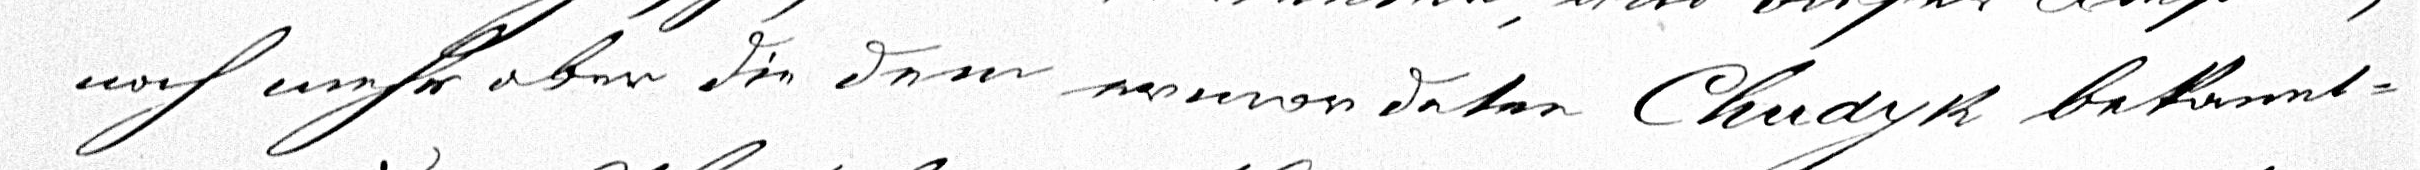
noch mehr aber die dem ermordetenChudyk bekannt¬
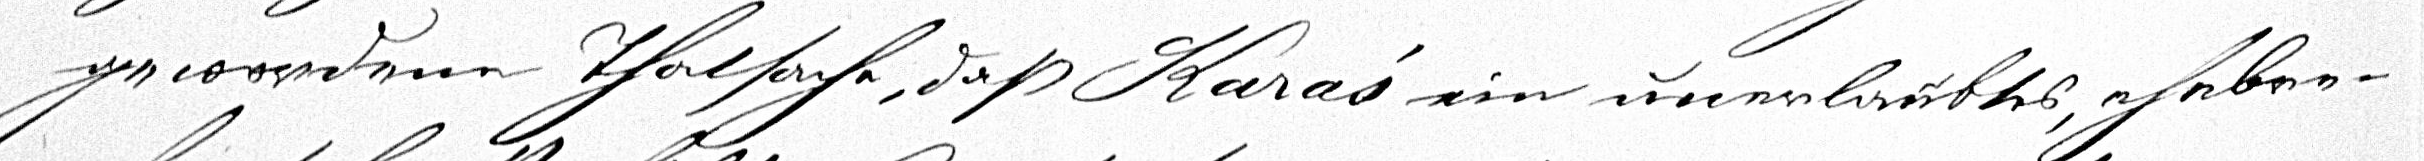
gewordene Thatsache, daßKaraś ein unerlaubtes, ehebr¬
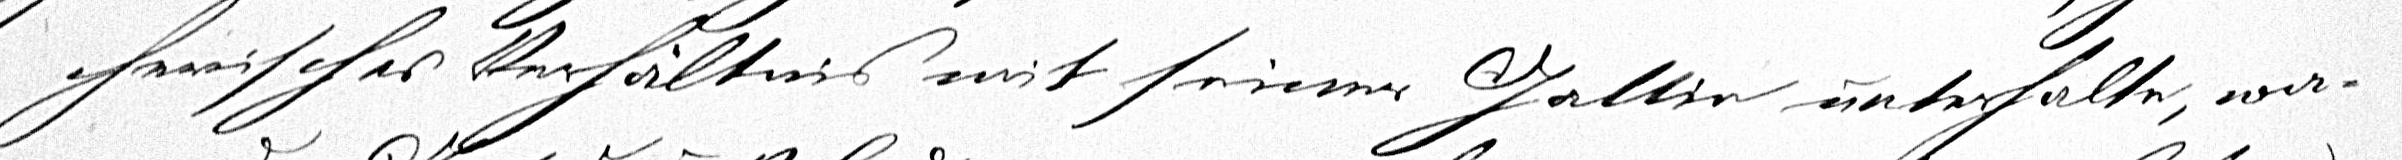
echerisches Verhältnis mit seiner Gattin unterhalte, wa¬
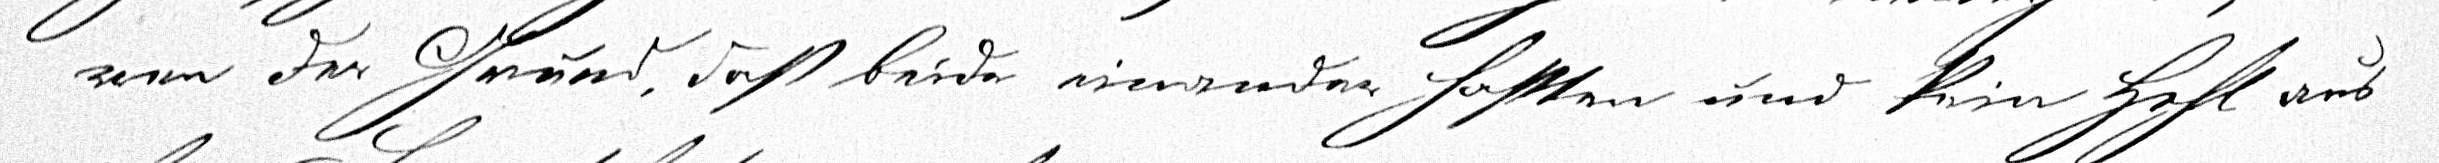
ren der Grund, daß beide einander haßten und kein Hehl aus
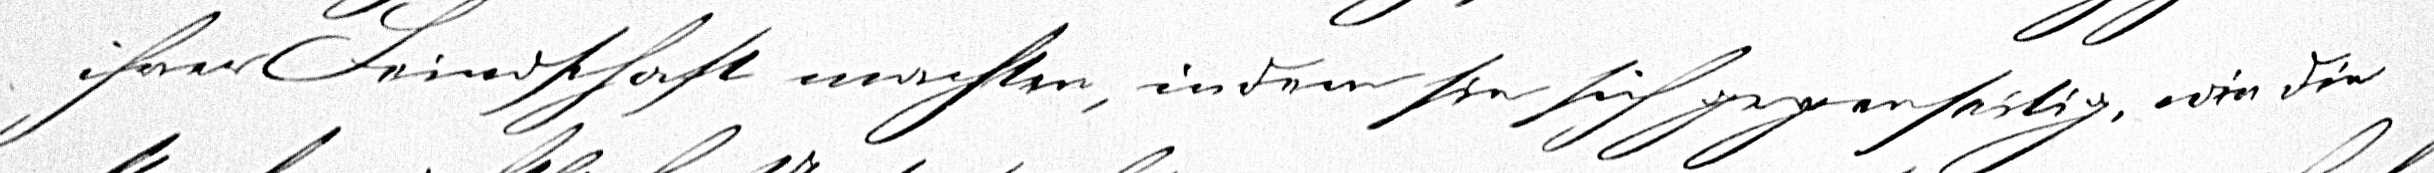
ihrer Feindschaft machten, indem sie sich gegenseitig, wie die
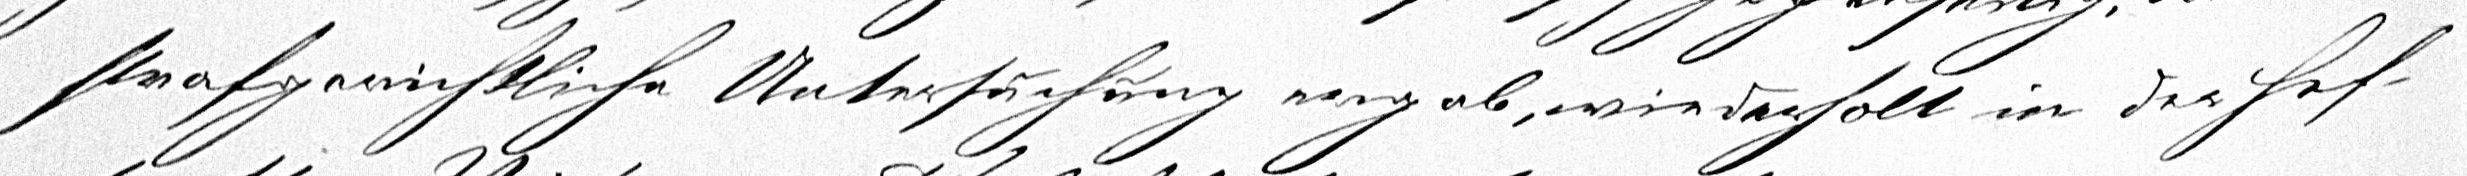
Strafgerichtliche Untersuchung ergab, wiederholt in der hef¬
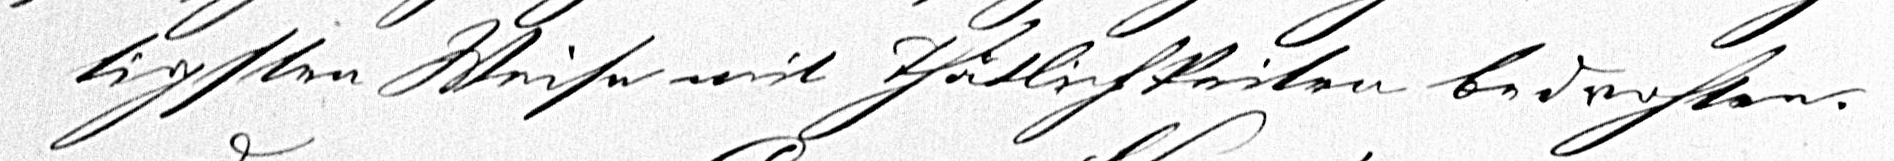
tigsten Weise mit Thätlichkeiten bedrohten.
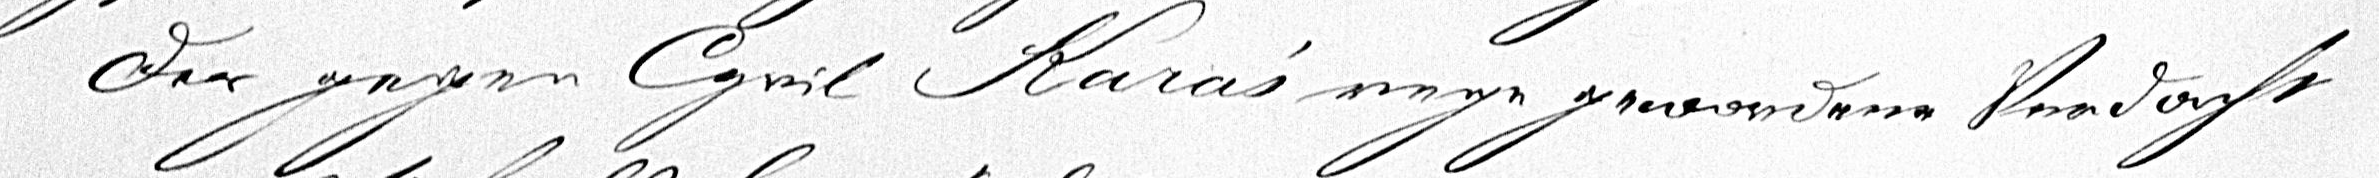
Der gegen Cyril Karaś rege gewordene Vedacht¬
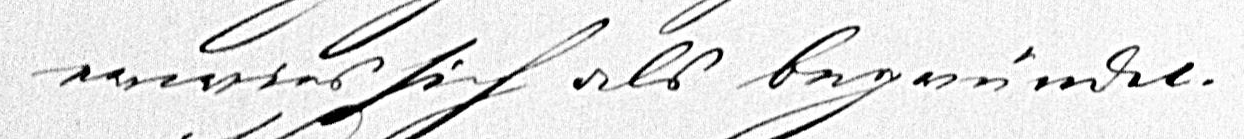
erwies sich als begründet.
